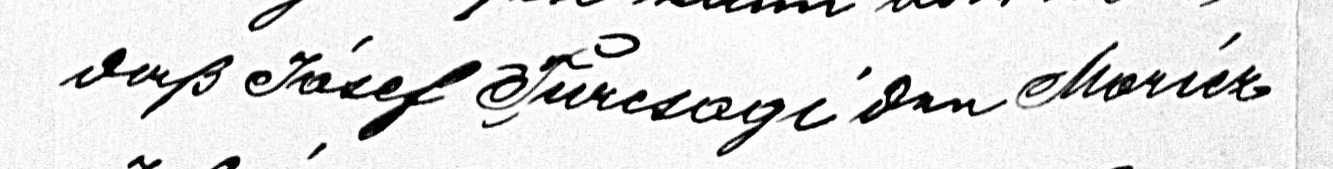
daß Jósef Furcsogi den Moricz
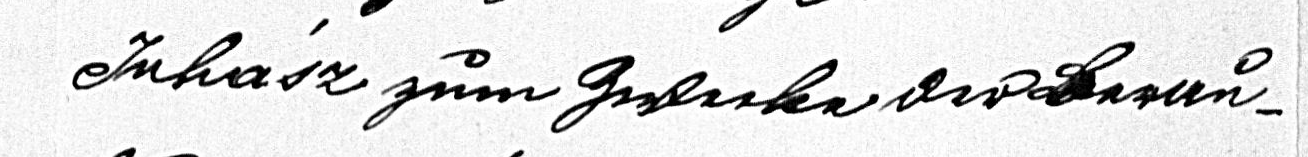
Inhász zum Zwecke der Berau¬
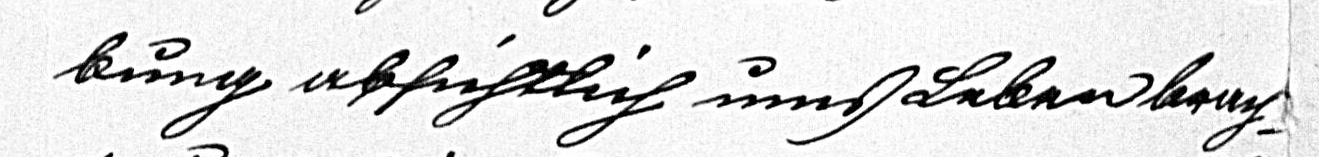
kung absichtlich brach¬
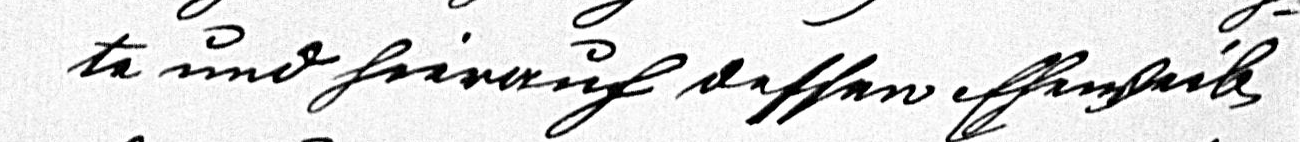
te und hierauf dessen Eheweib
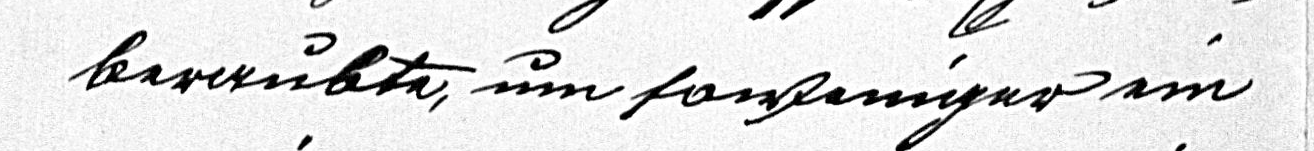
beraubte, um soweniger ein
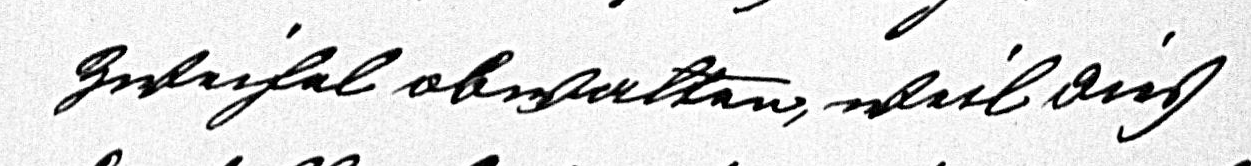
Zweifel obwalten, weil dies
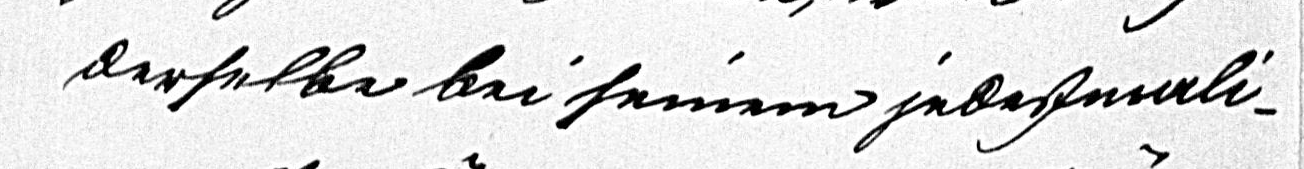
derselbe bei seinem jedesmali¬
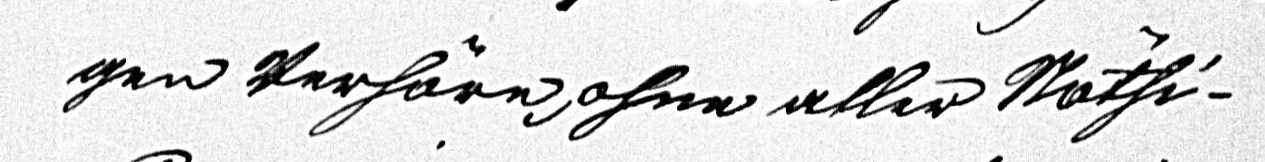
gen Verhörn ohne aller Nöthi¬
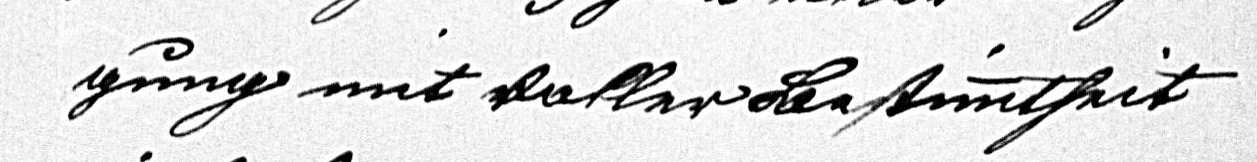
gung mit voller Bestimmtheit
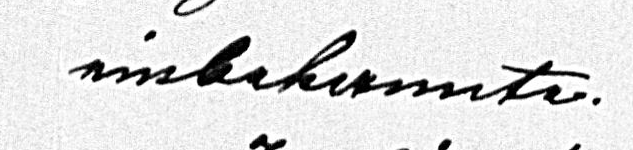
einbekannte.
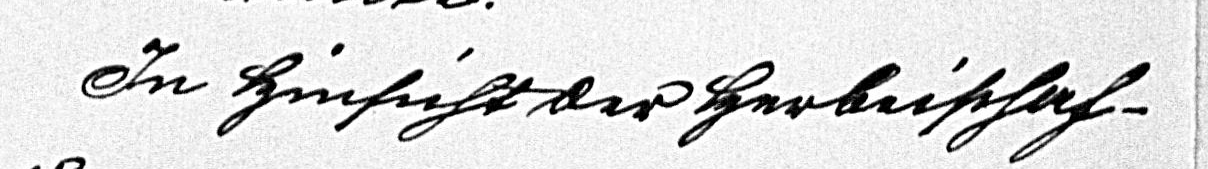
In Hinsicht der Herbeischaf¬
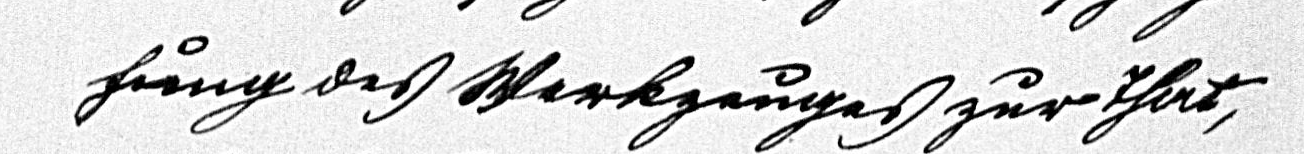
fung des Werkzeuges zur That,
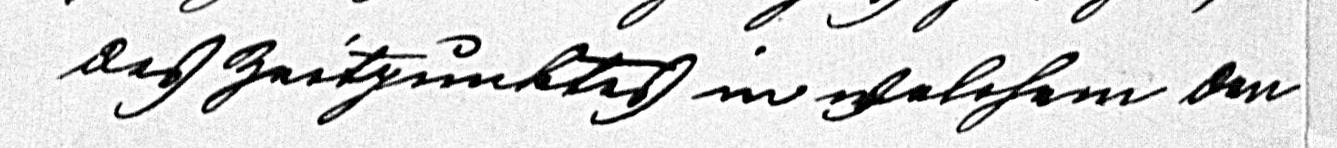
des Zeitpunktes in welchem den
